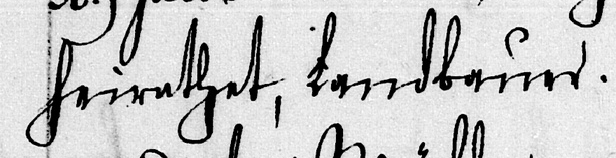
heirathet, Landbauer.
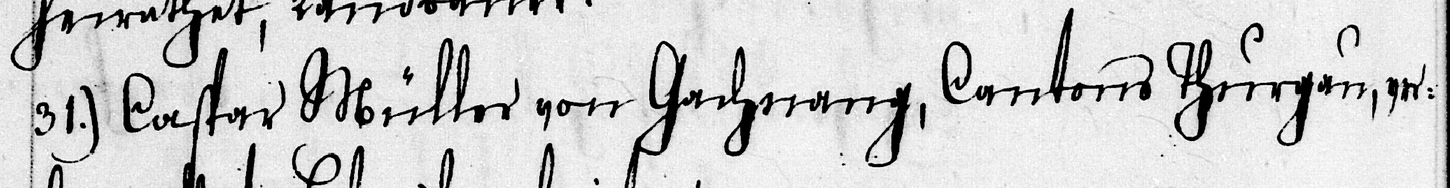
31.) Caspar Müller von Gachnang, Cantons Thurgau. ver¬
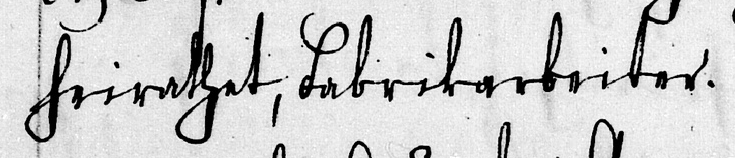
heirathet, Fabrikarbeiter.
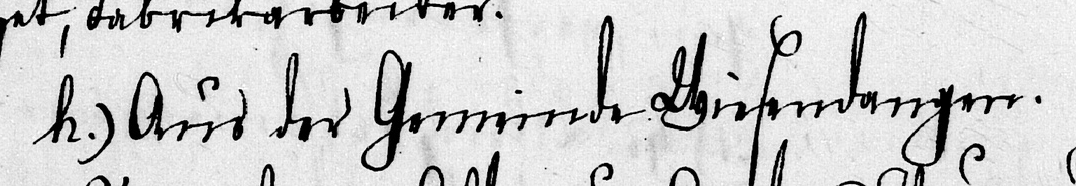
h.) Aus der Gemeinde Wiesendangen.
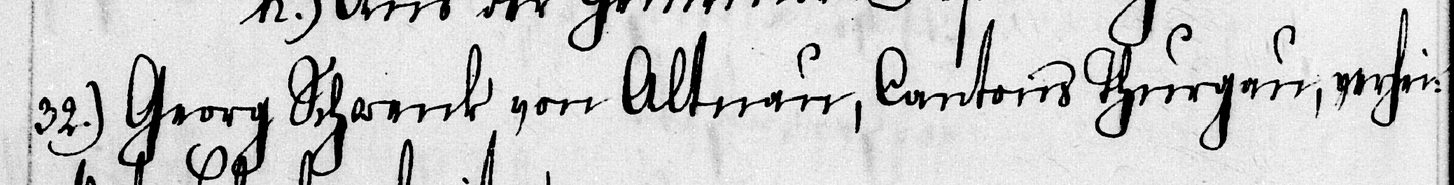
32.) Georg Schwenk von Altnau, Cantons Thurgau, verhei¬
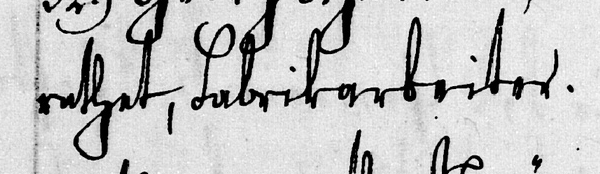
rathet, Fabrikarbeiter.
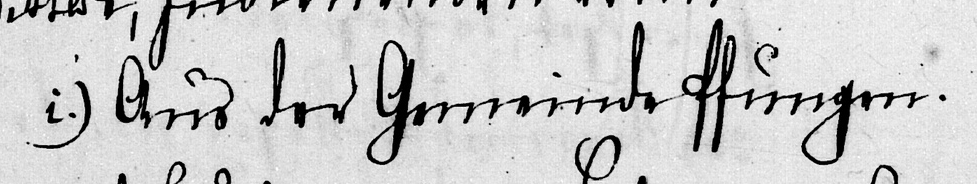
i.) Aus der Gemeinde Pfungen.
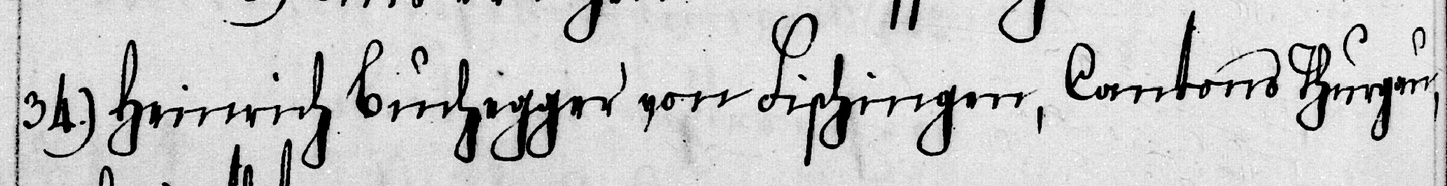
34.) Heinrich Buchegger von Fischingen, Cantons Thurgau,
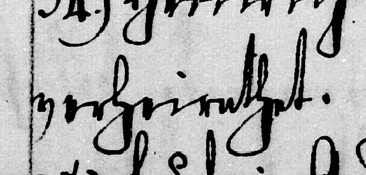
verheirathet.
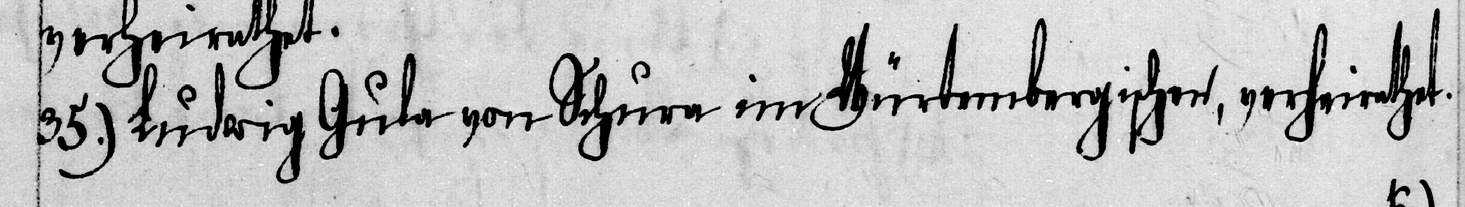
35.) Ludwig Gula von Schura im Würtembergischen, verhei¬
